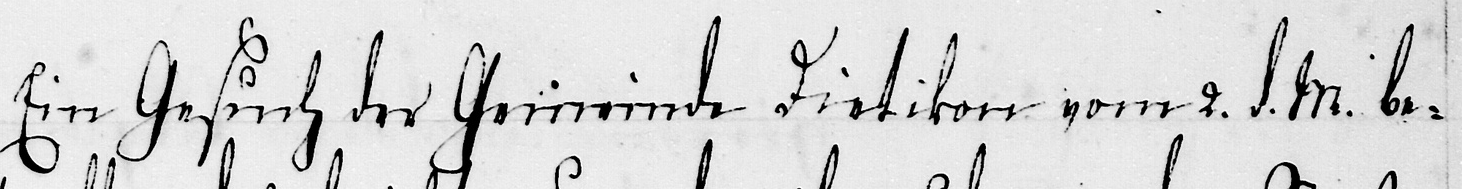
Ein Gesuch der Gemeinde Dietikon vom 2. d. M. be¬
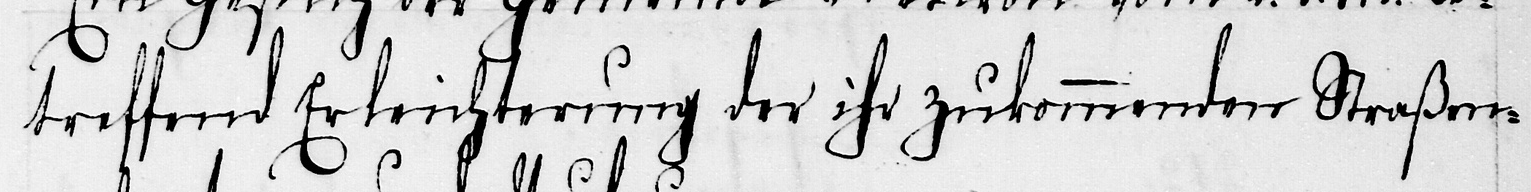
treffend Erleichterung der ihr zukommenden Straßen¬
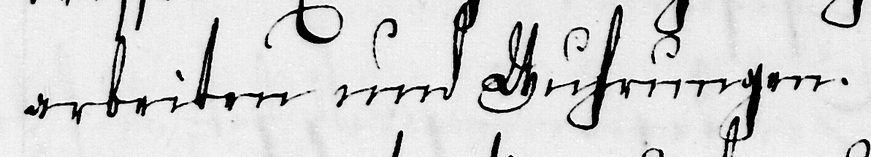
arbeiten und Wuhrungen.
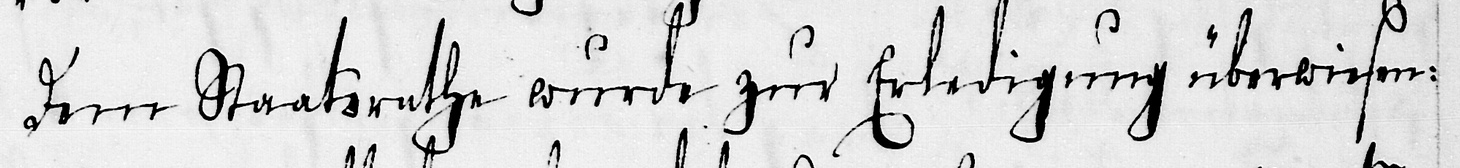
Dem Staatsrathe wurde zur Erledigung überwiesen:
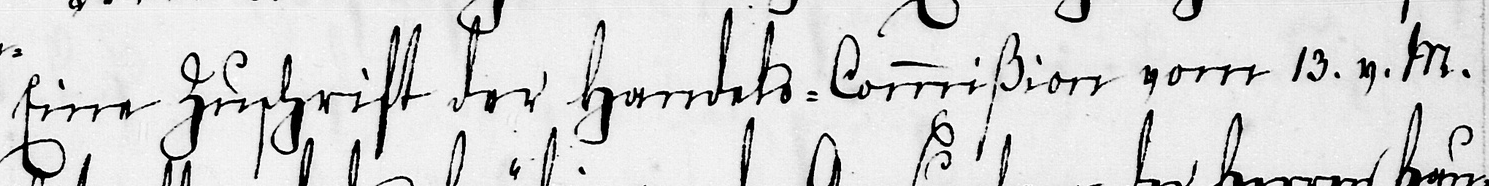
Eine Zuschrift der Handels-Commißion vom 13. v. M.
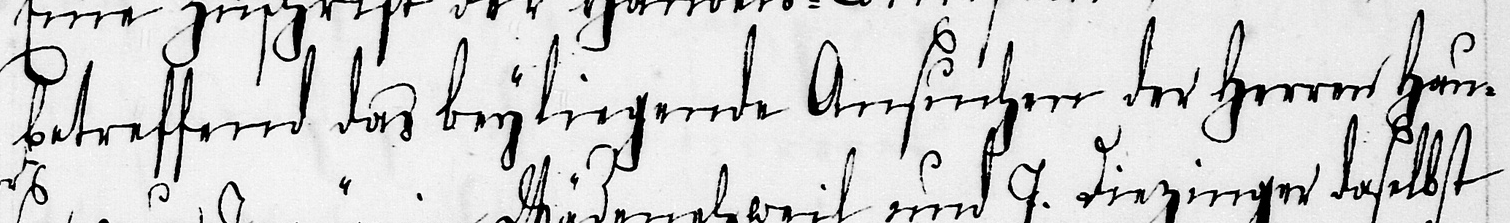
betreffend das beyliegende Ansuchen der Herren Hau¬
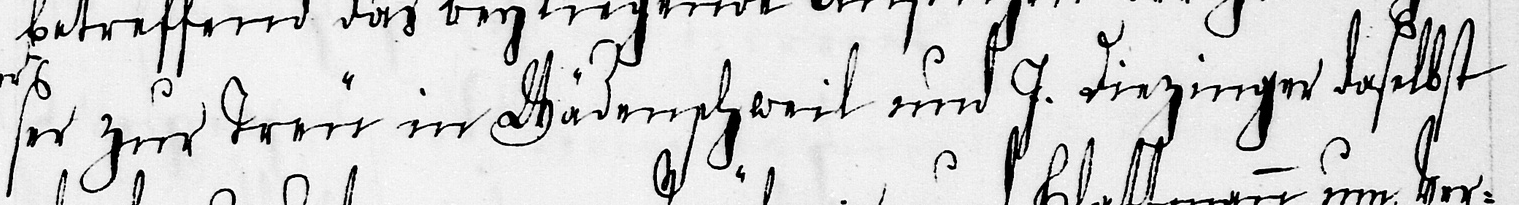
ser zur Treu in Wädenschweil und J. Diezinger daselbst
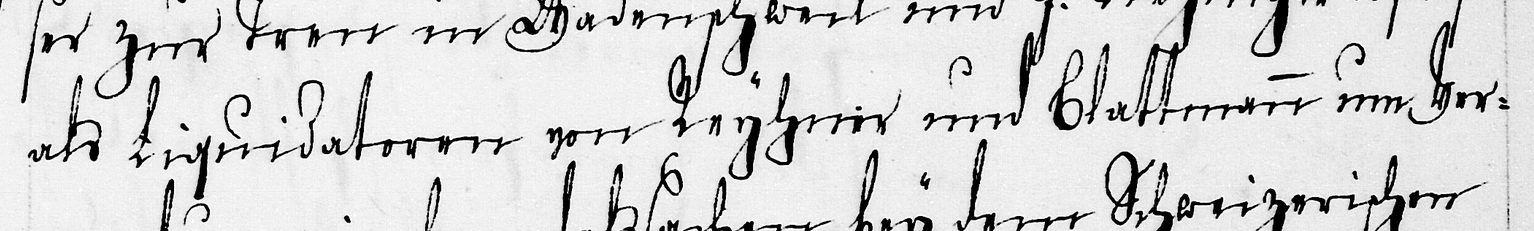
als Liquidatoren von Reyhner und Blattmann um Ver¬
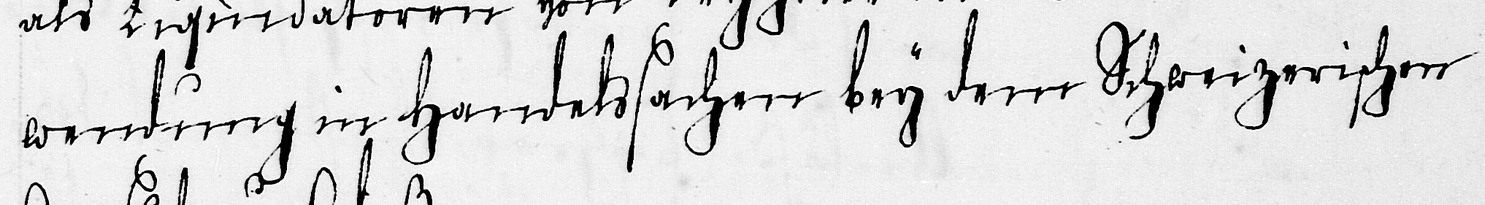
wendung in Handelssachen bey dem Schweizerischen
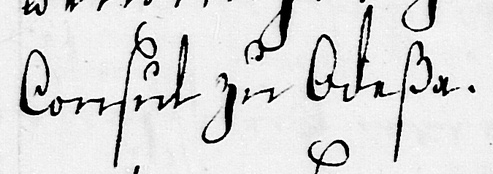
Consul zu Odeßa.
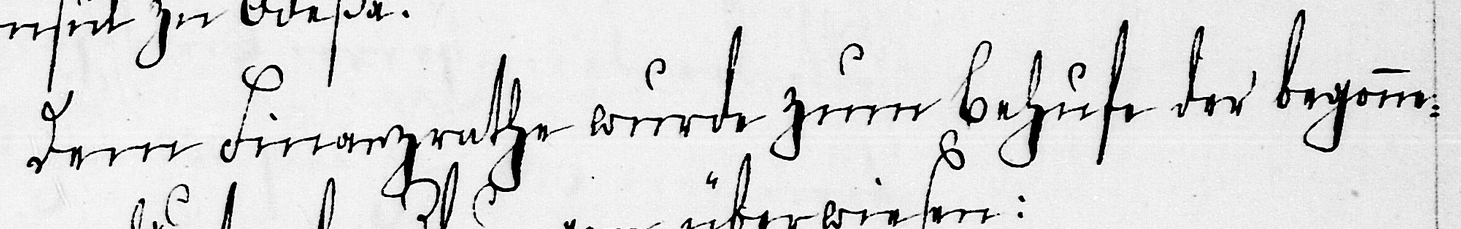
Dem Finanzrathe wurde zum Behufe der begonne¬
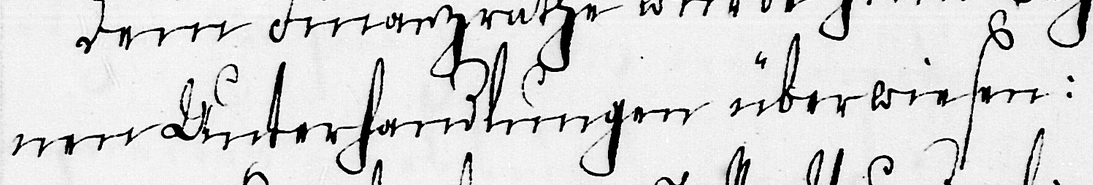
nen Unterhandlungen überwiesen:
